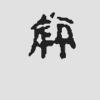常
